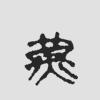黃
